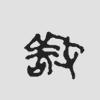敬
